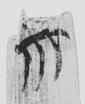示
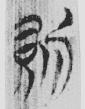斤
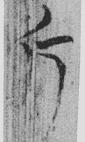而
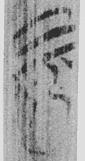母（毋）
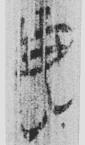谷（欲）
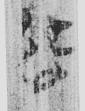安（焉）
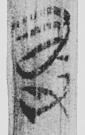𠭁
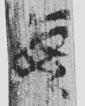𡚦
